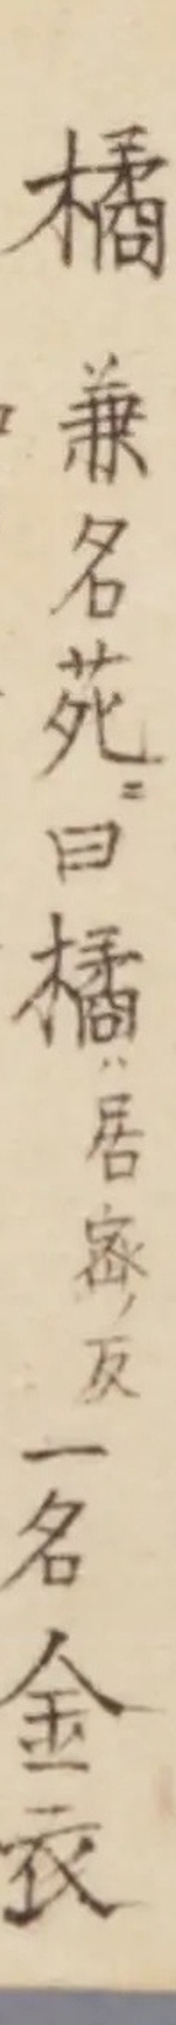橘兼名苑に曰橘は居密の反一名金衣
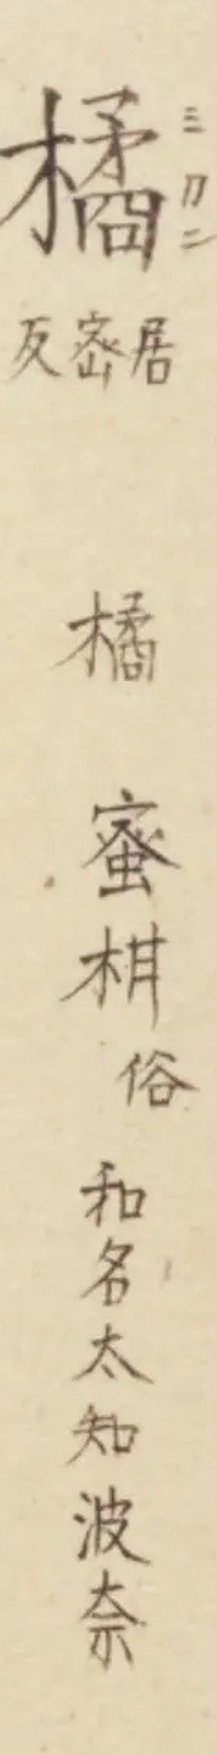橘居橘蜜柑俗和名太知波奈
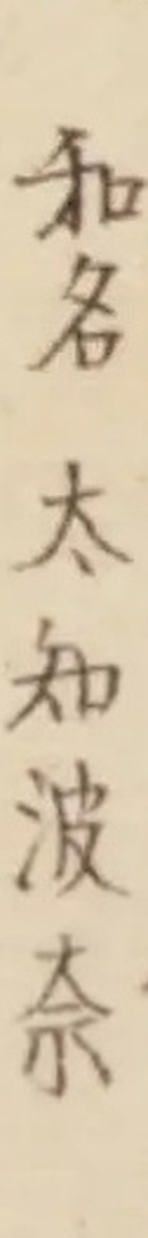和名太知波奈
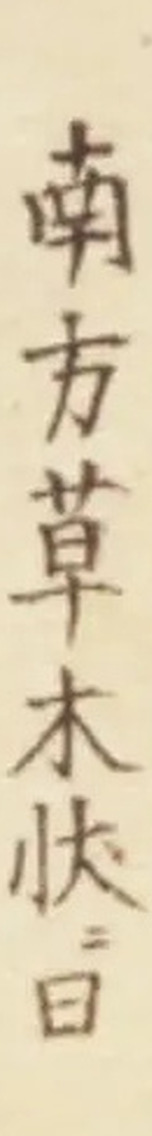南方草木状に曰
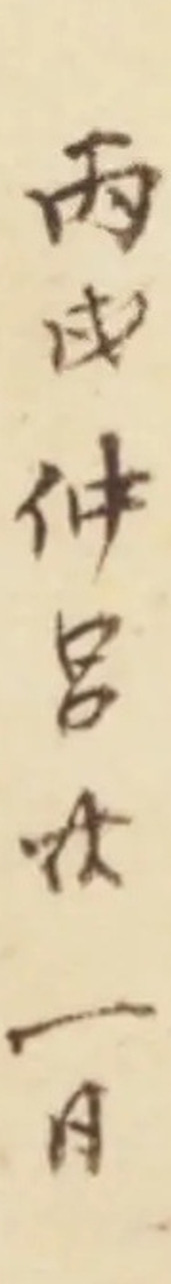丙戌仲呂廿一日
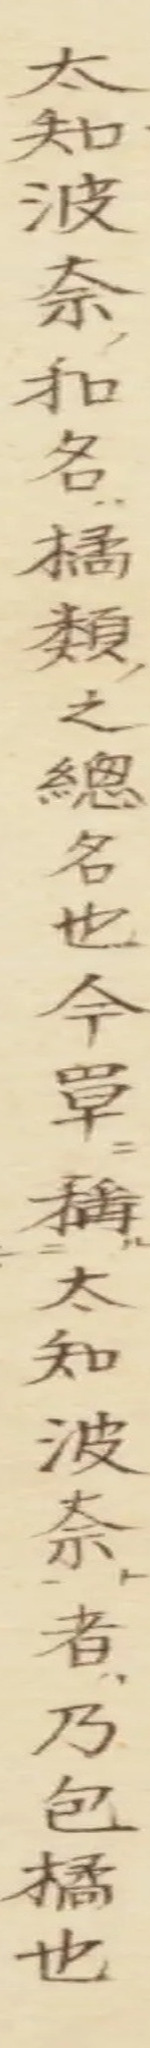太知波奈の和名は橘類之總名也今單に稱る太知波奈と者は乃包橘也
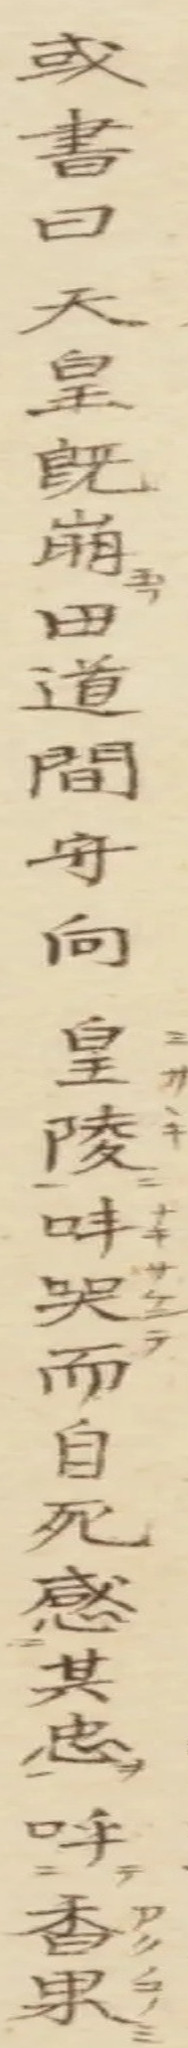或書曰天皇既崩玉ふ田道間守向皇陵咷哭而自死感其忠を呼て香果
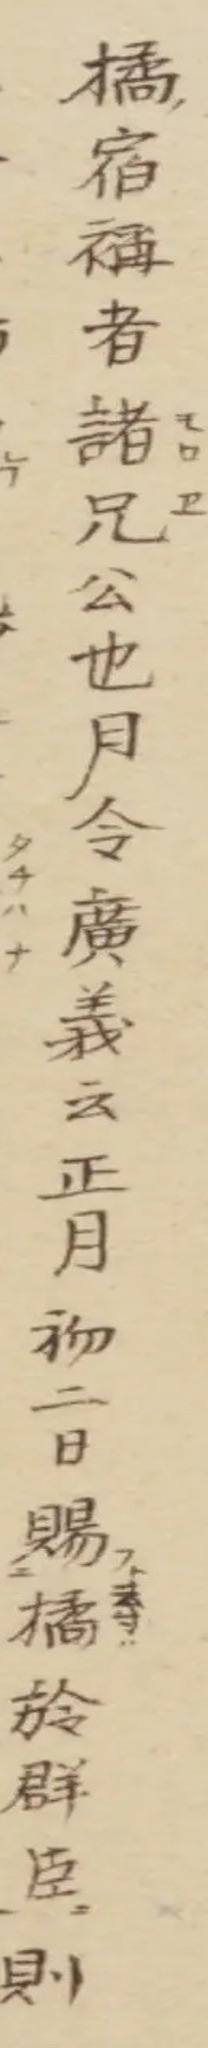橘の宿稱者諸兄公也月令廣義云正月初二日賜ふと云橘於群臣に則

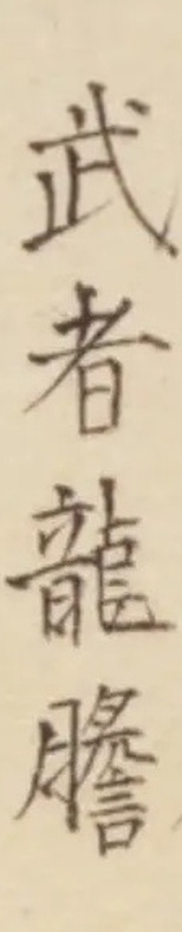武者龍謄
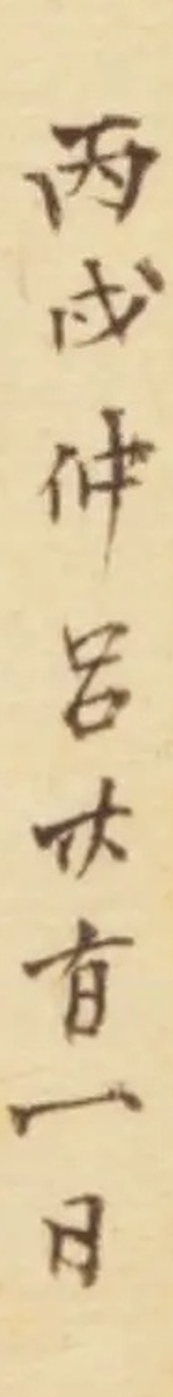丙戌仲呂廿一日
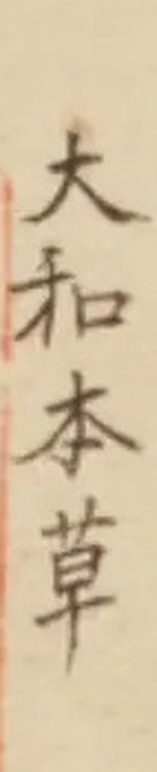大和本草

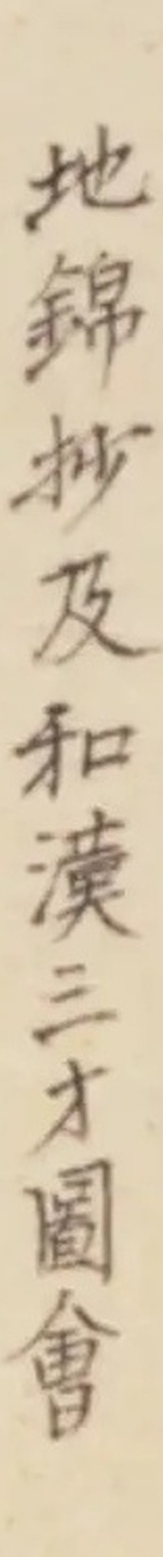地錦抄及和漢三才圖會
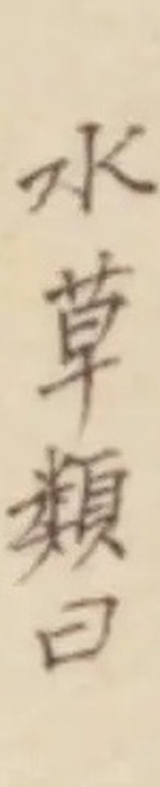水草類曰
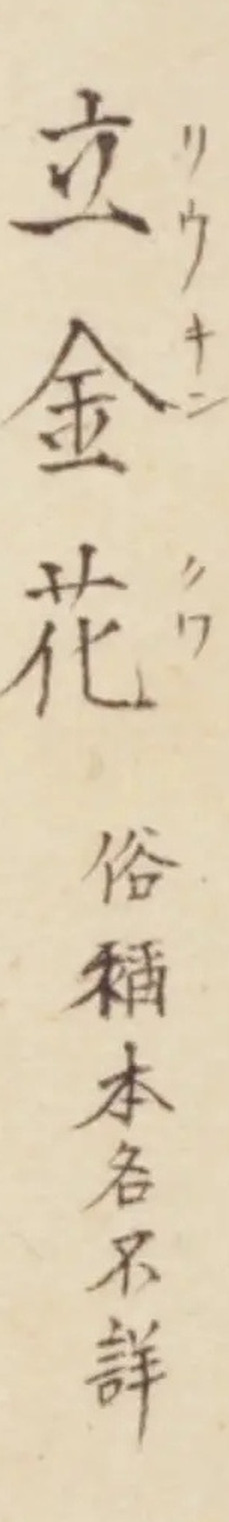立金花俗稱本名不詳
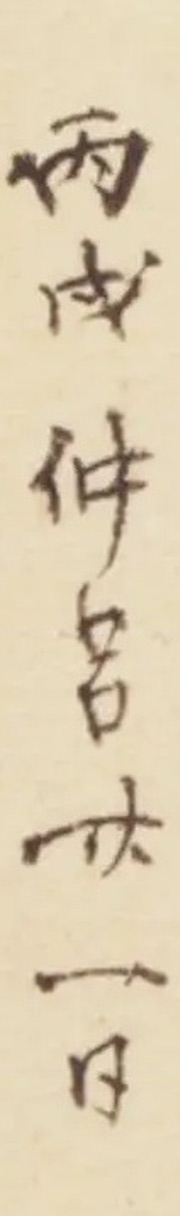丙戌仲呂廿一日
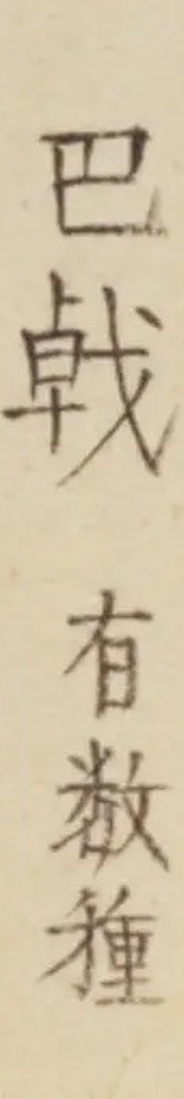巴戟有数種
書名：梅園草木花譜夏之部. 3
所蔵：国立国会図書館 National Diet Library, JAPAN
